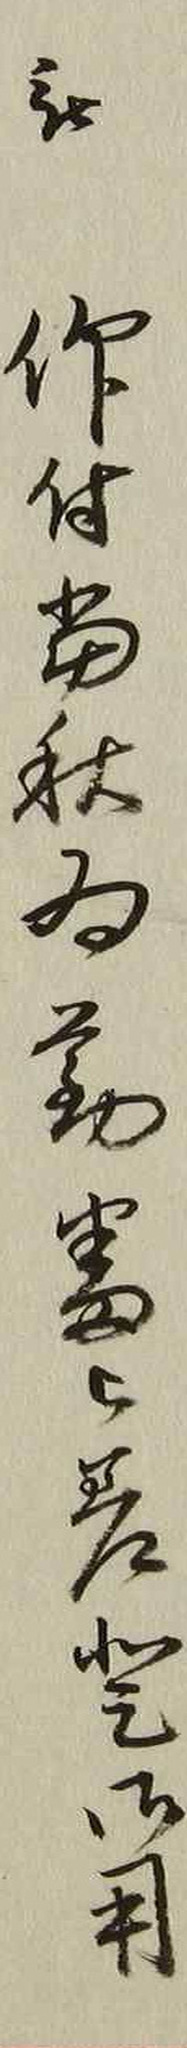被仰付当秋為勤番被差登御用
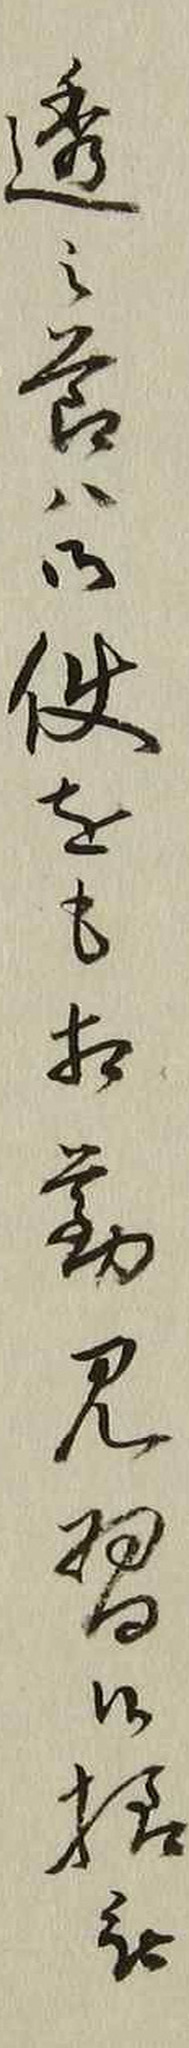透之節は御使をも相勤見習候様被
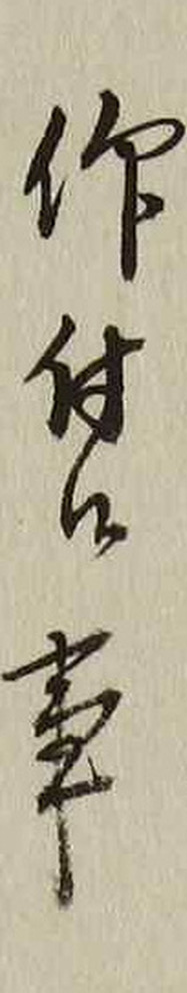仰付候事
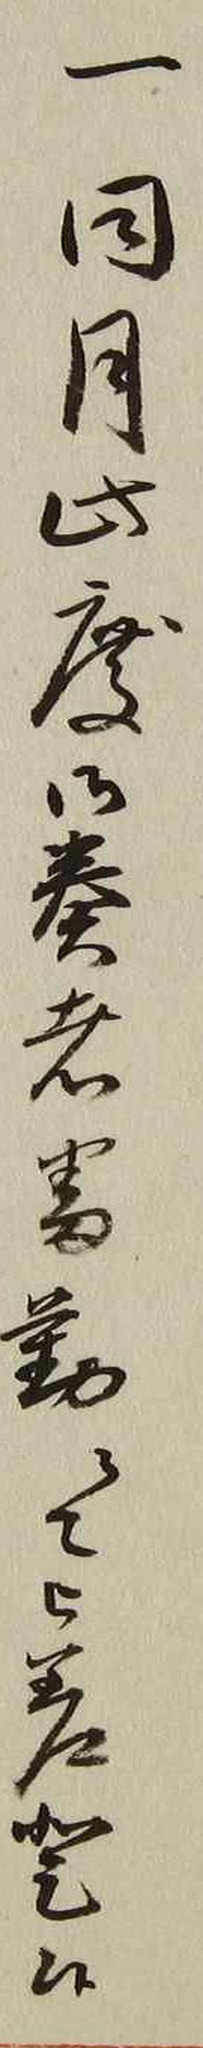一同月此度御奏者番にて被差登候
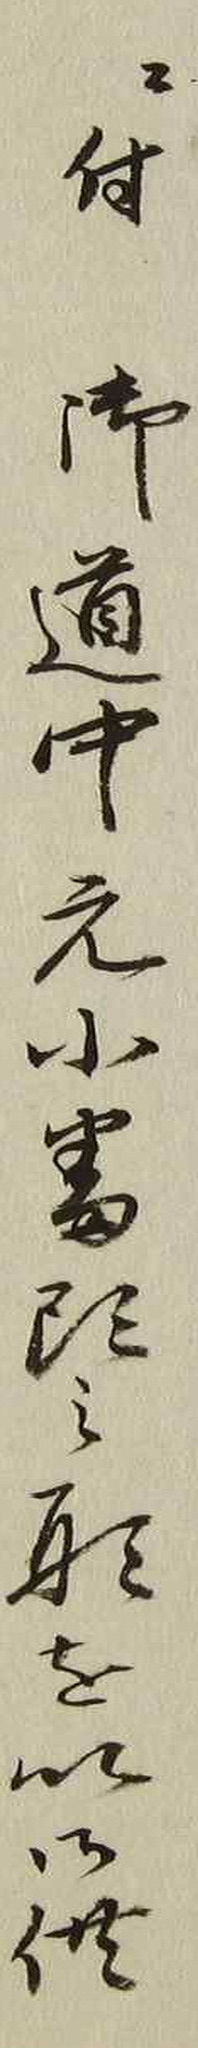に付御道中元小番頭之形を以御供
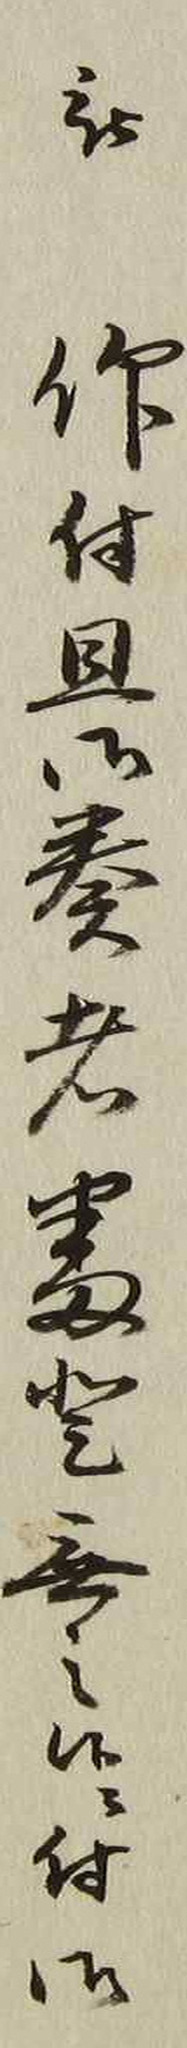被仰付且御奏者番登無之候に付御
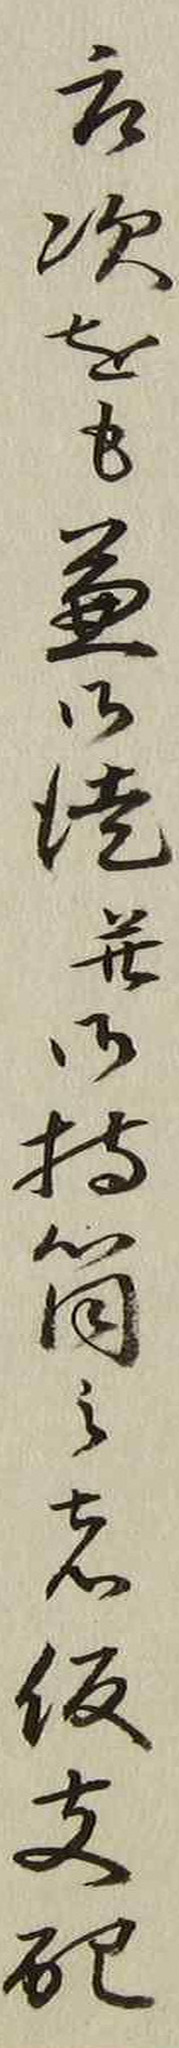取次をも兼御徒并御持筒之者仮支配
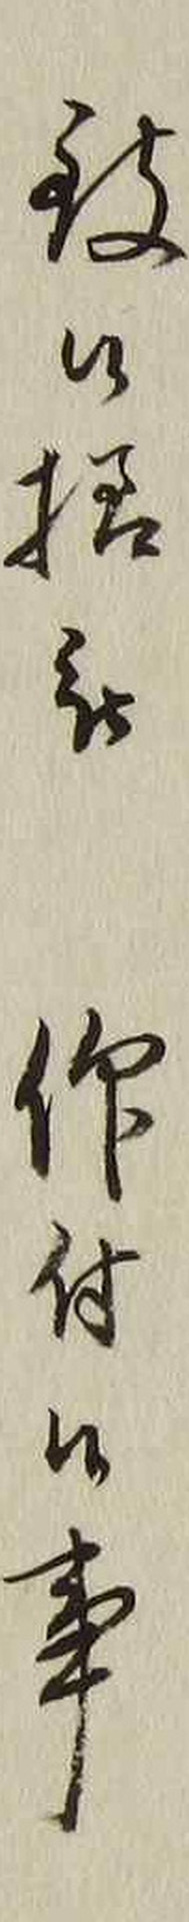致候様被仰付候事
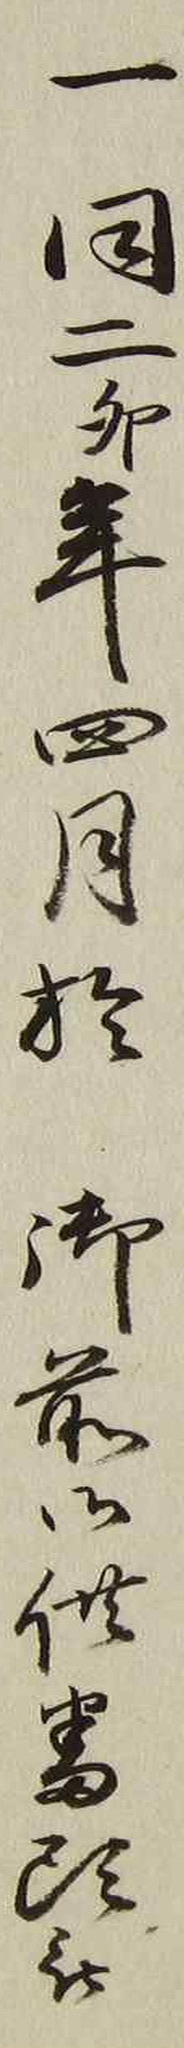一同二卯年四月於御前御供番頭被
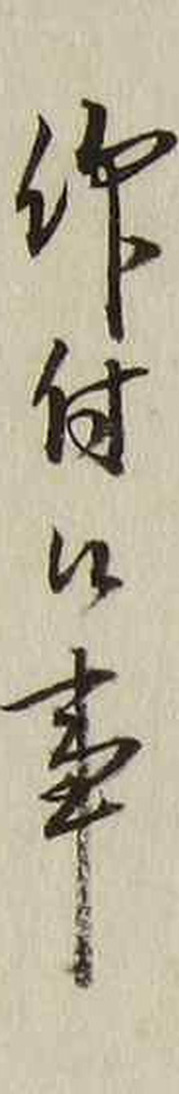仰付候事
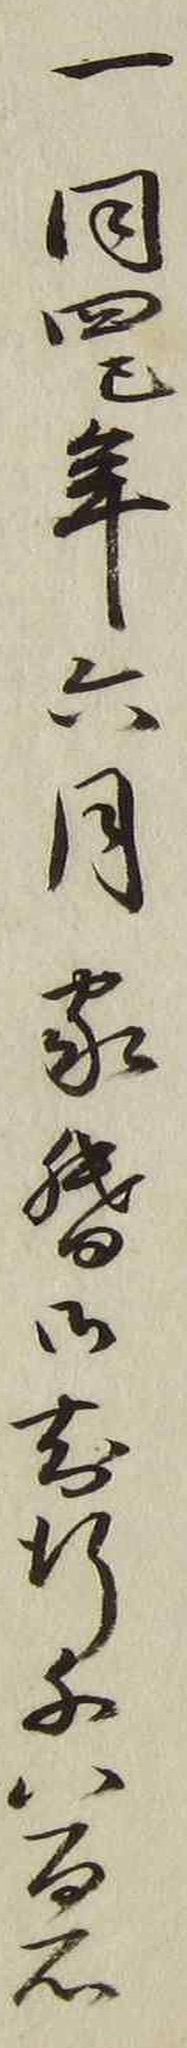一同四巳年六月家督御知行千八百石
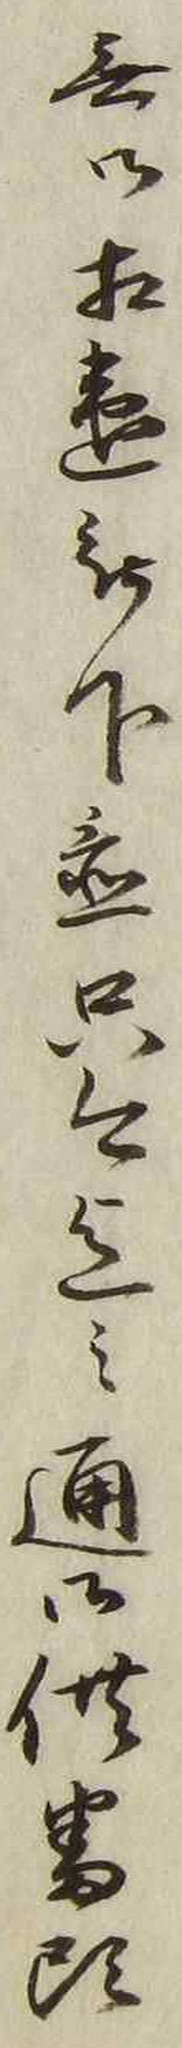無御相違被下置只今迄之通御供番頭

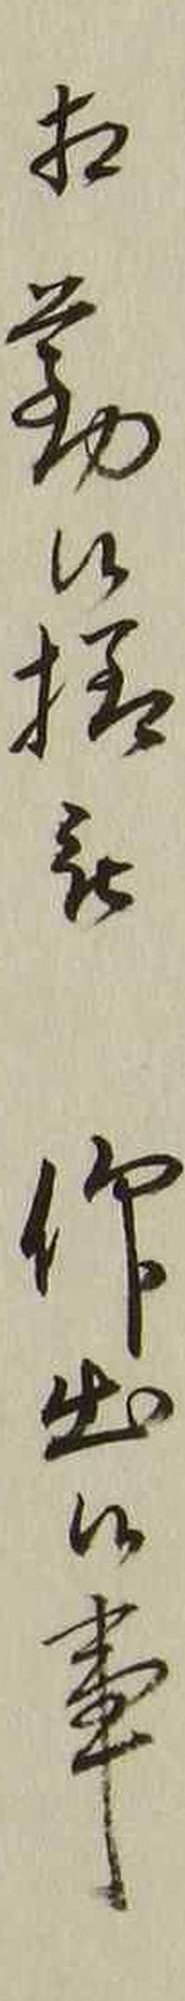相勤候様被仰出候事
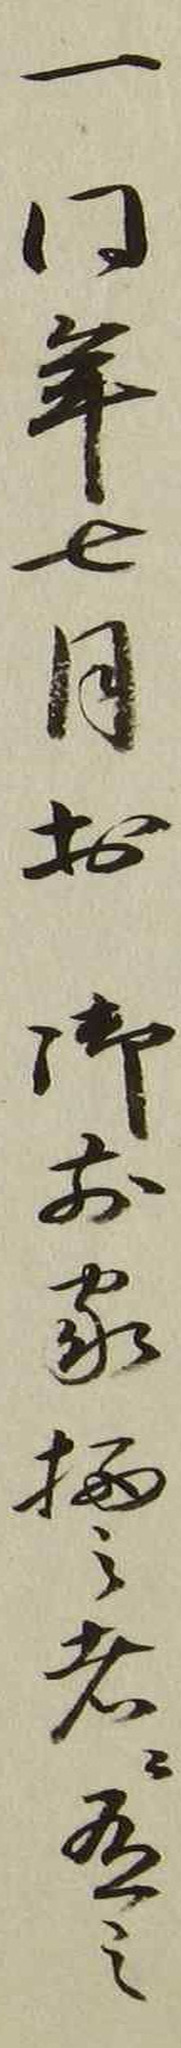一同年七月於御前家柄之者に有之
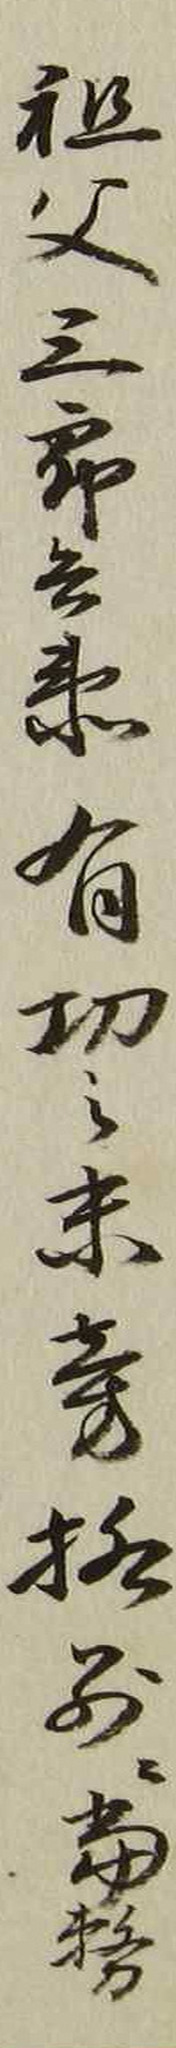祖父三郎兵衛有功之末旁格別に当務
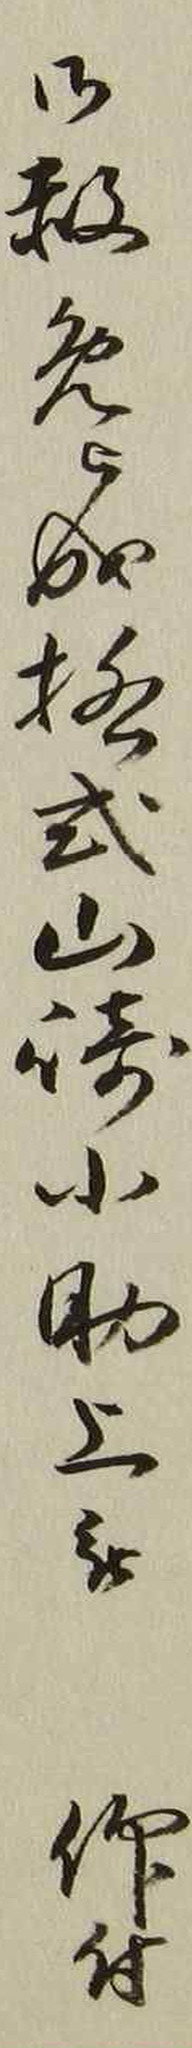御赦免被成格式山崎小助上被仰付
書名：諸士系譜　巻之125　た之部1
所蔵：会津若松市立会津図書館
